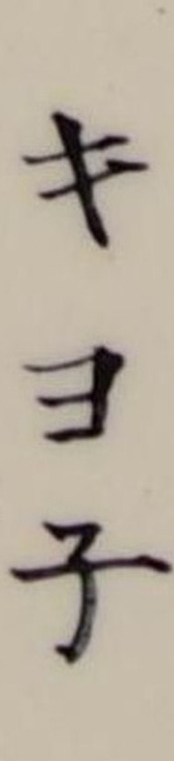キヨ子
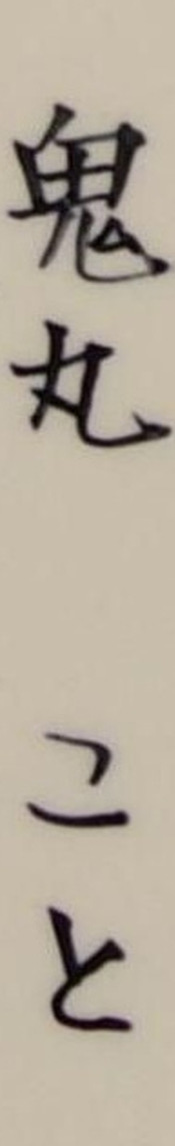鬼丸こと
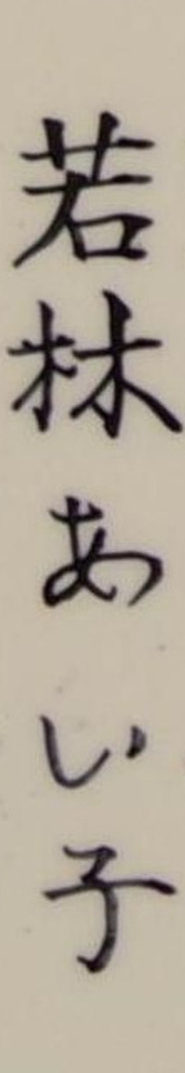若林あい子
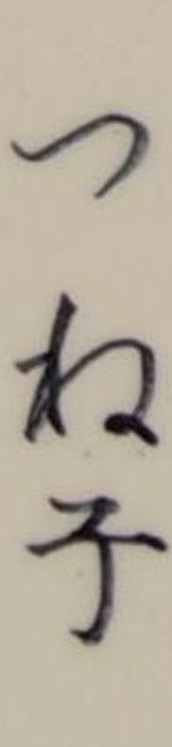つね子
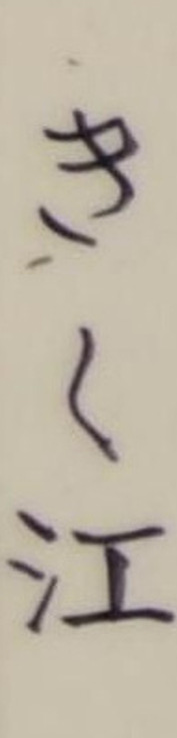きく江

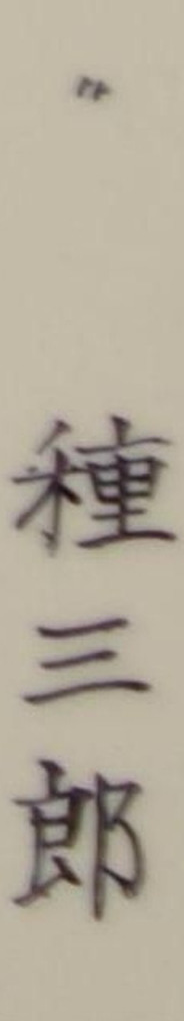種三郎
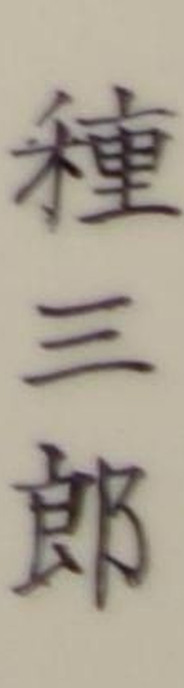種三郎
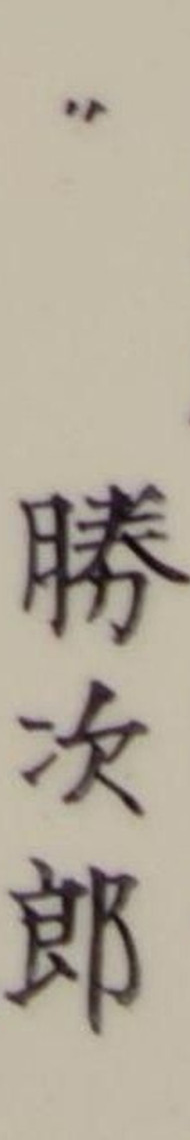勝次郎
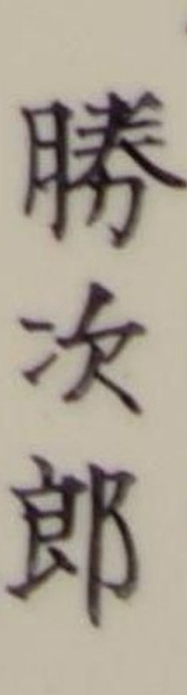勝次郎
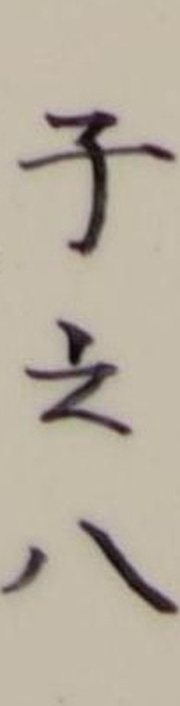子之八
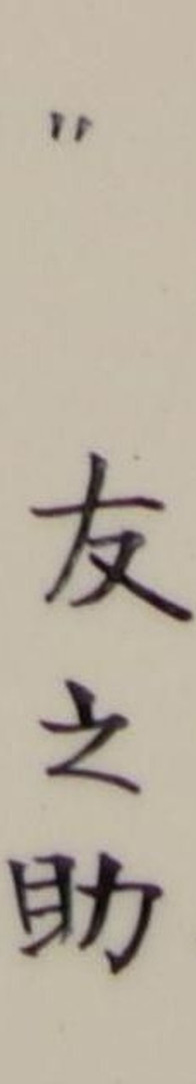友之助
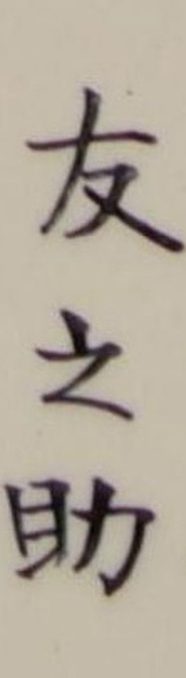友之助
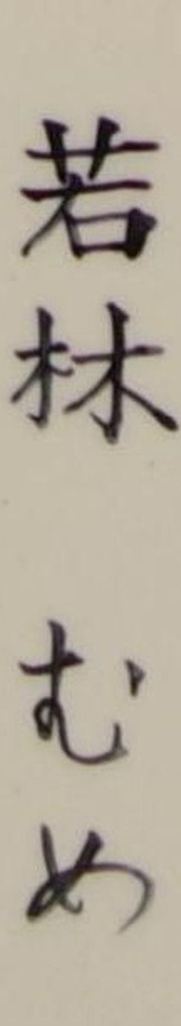若林むめ
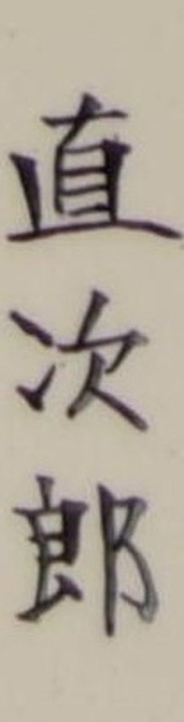直次郎
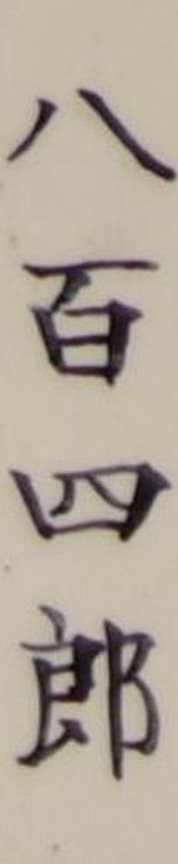八百四郎
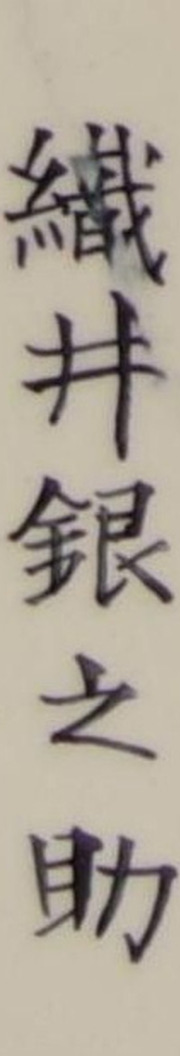織井銀之助
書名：E~L
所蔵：高野山金剛峯寺
